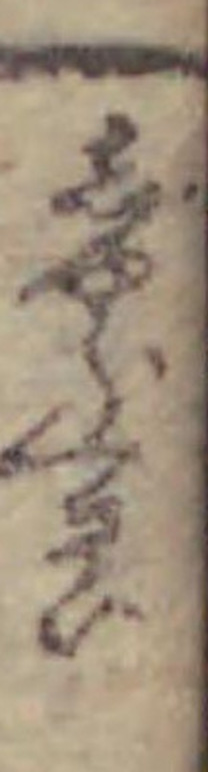しやらくさい
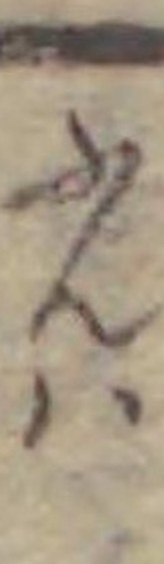ふんは
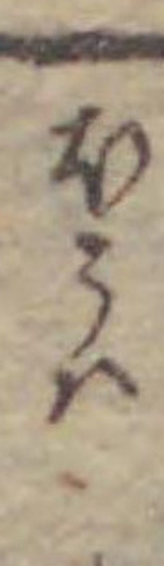ほうは
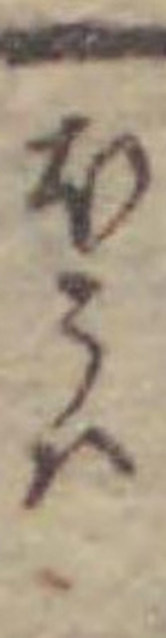ほうは
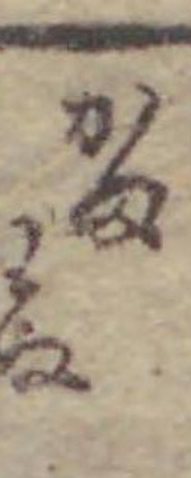かまわぬ
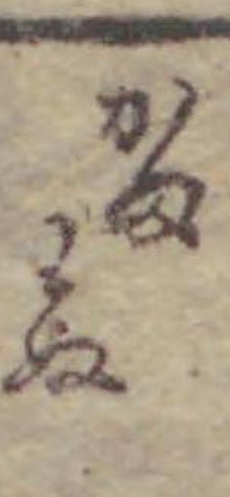かまわぬ
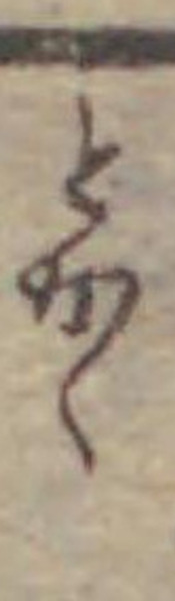とかく
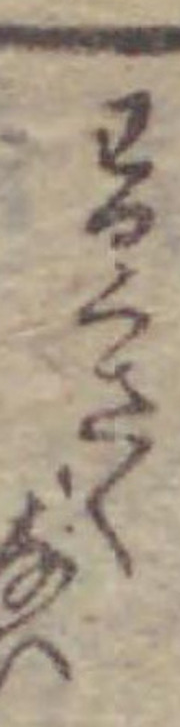わるくさくない
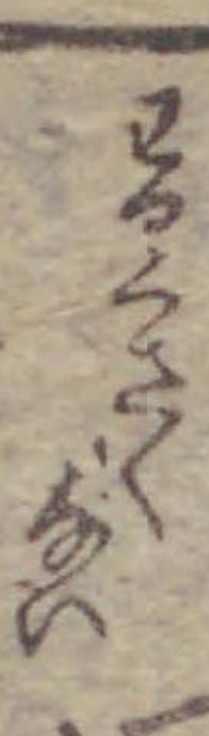わるくさくない
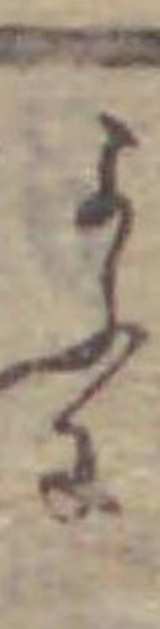よふに
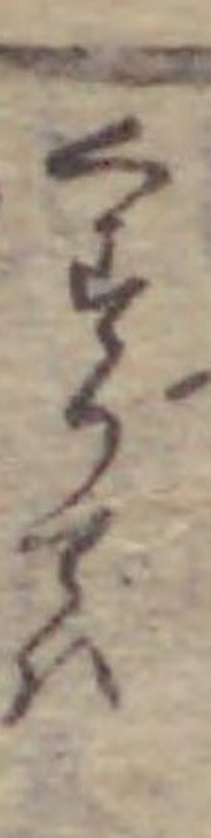くすりでは
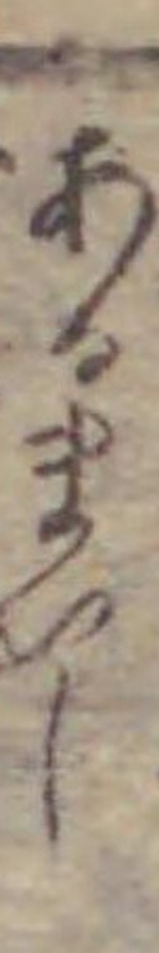あるまいし
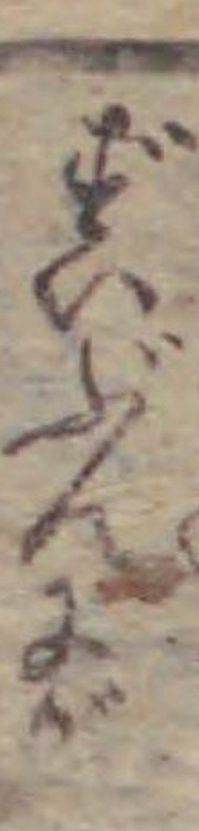ずいぶんにが
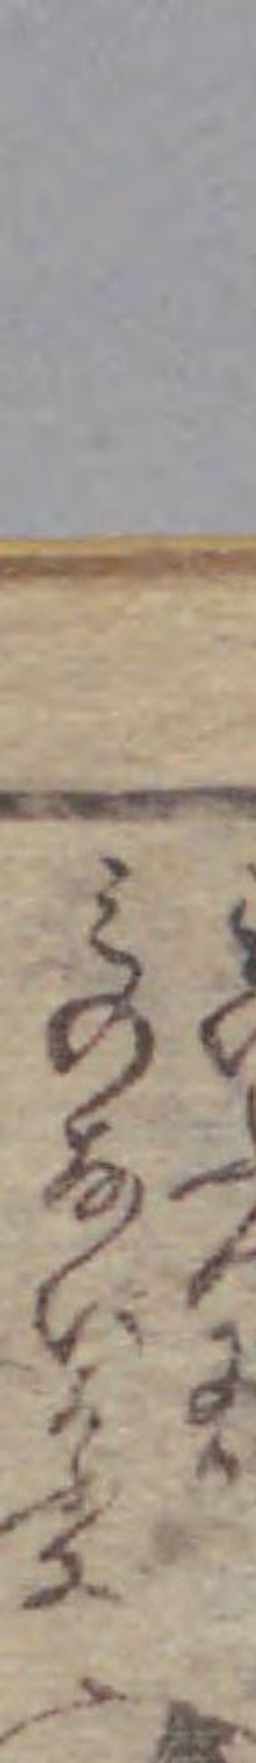みのないよふに
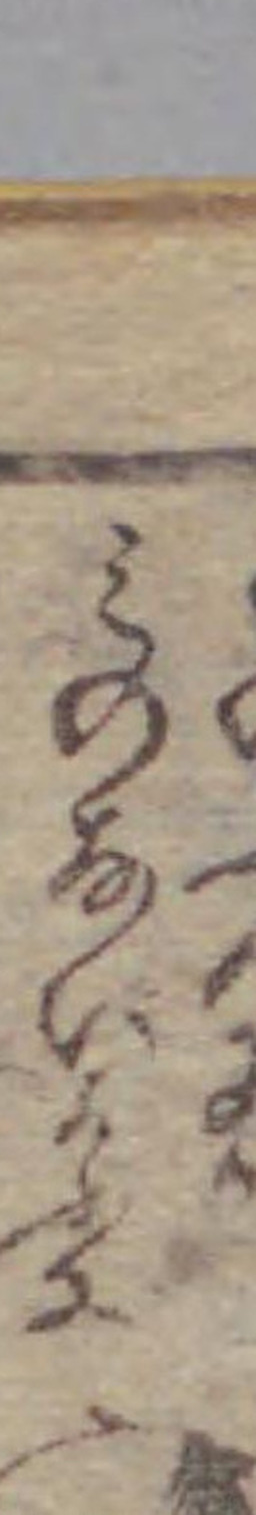みのないよふに
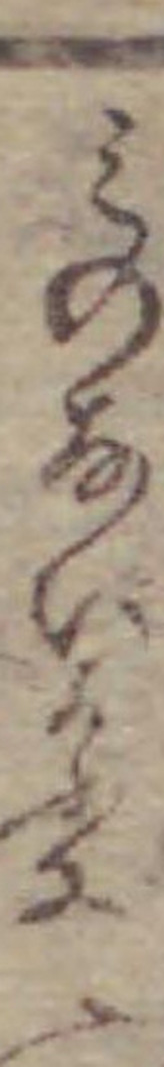みのないよふに
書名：談芭菰誉詞 : 3巻
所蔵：国立国会図書館 National Diet Library, JAPAN
